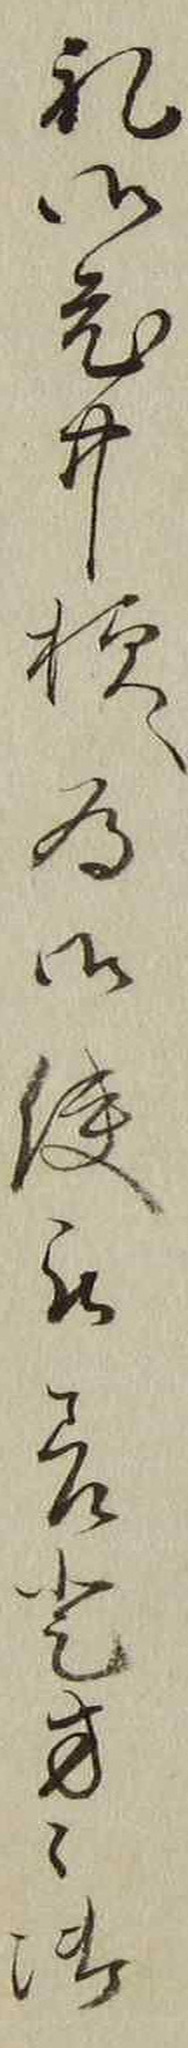礼御老中様へ為御使被差登方々御
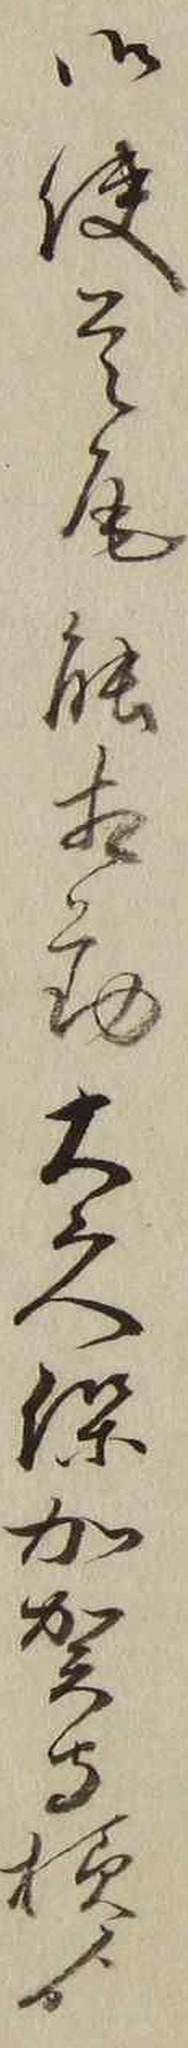御使首尾能相勤大久保加賀守様ゟ
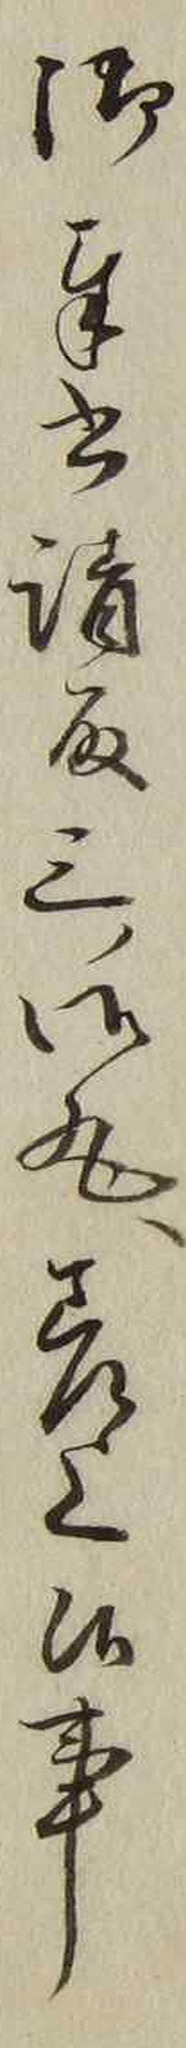御奉書請取三ノ御丸へ差上候事

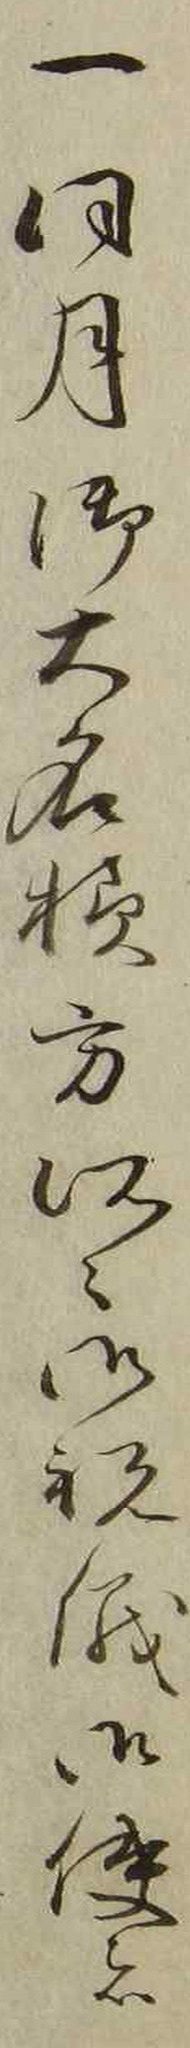一同月御大名様方所々御祝儀御使者
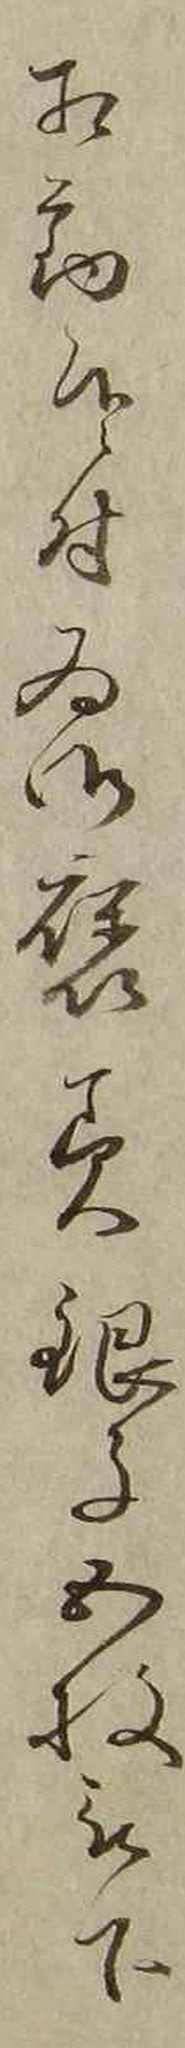相勤候ニ付為御褒美銀子五枚被下
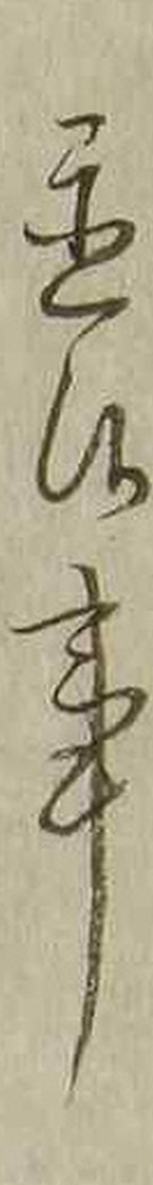置候事
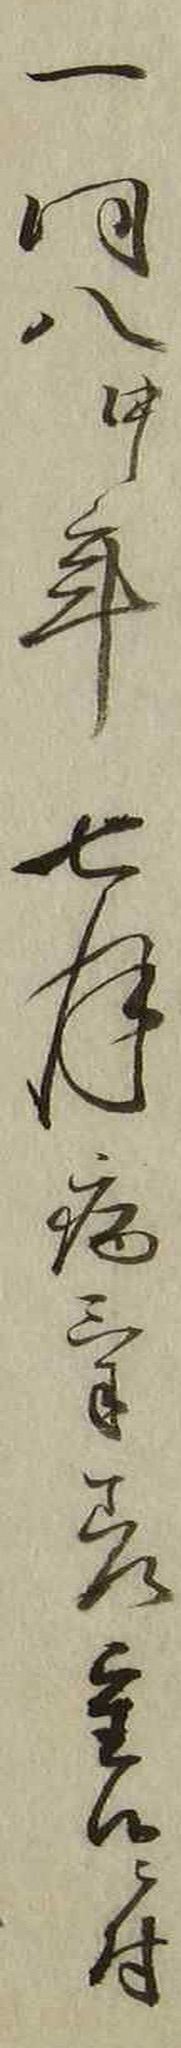一同八申年七月病気差重候ニ付
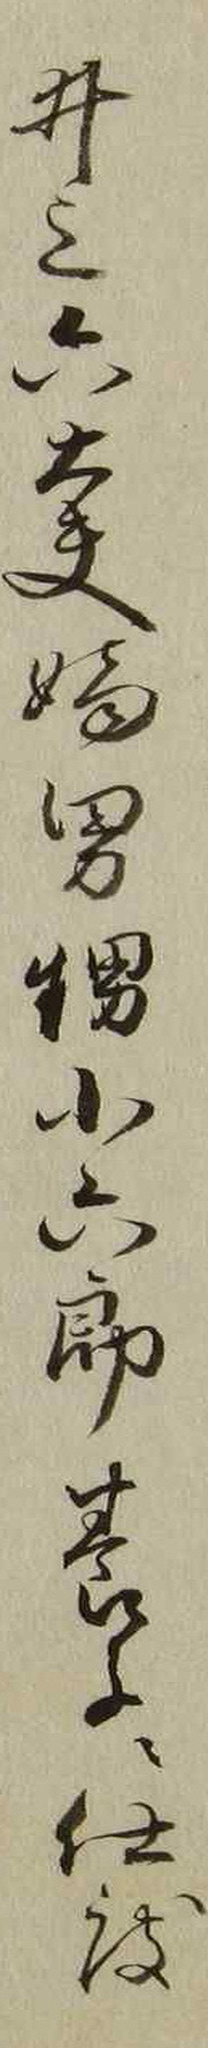井上六大夫嫡男甥小六郎養子ニ仕度
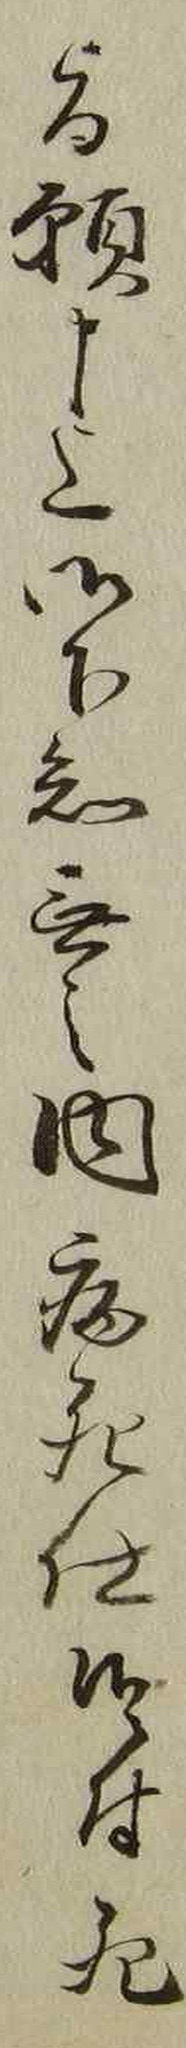旨願申上御下知無之内病死仕候ニ付死
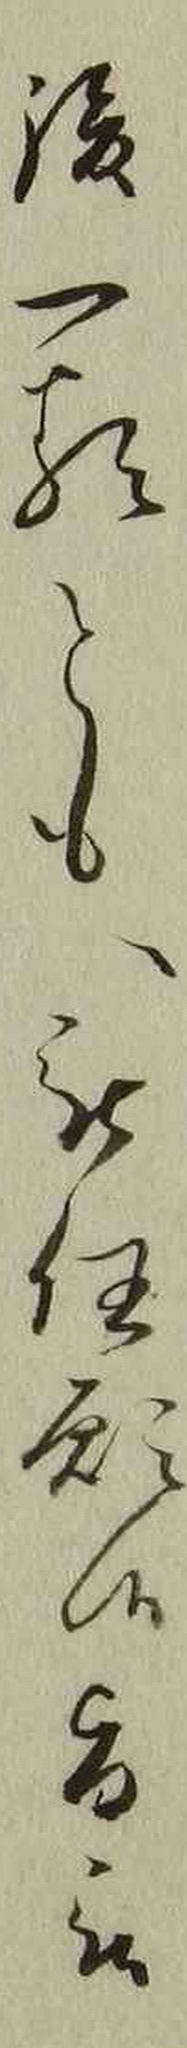後一類ともへ被任願候旨被
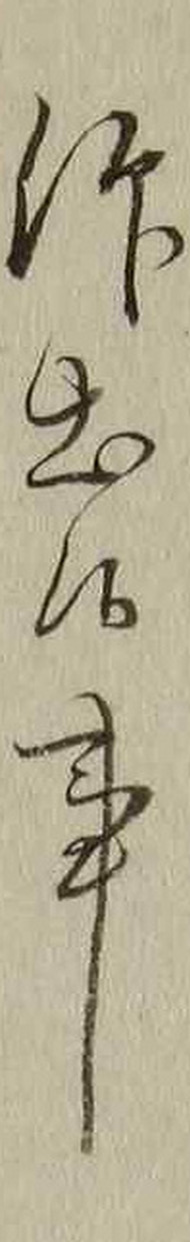仰出候事
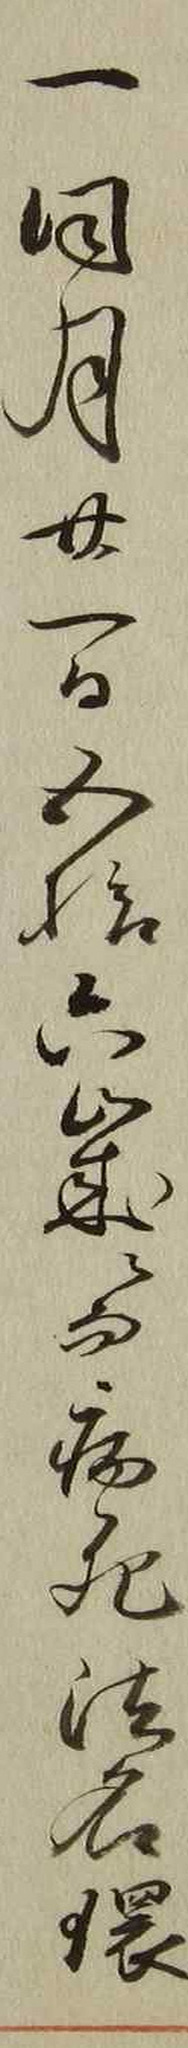一同月廿一日五拾六歳ニ而病死法名環
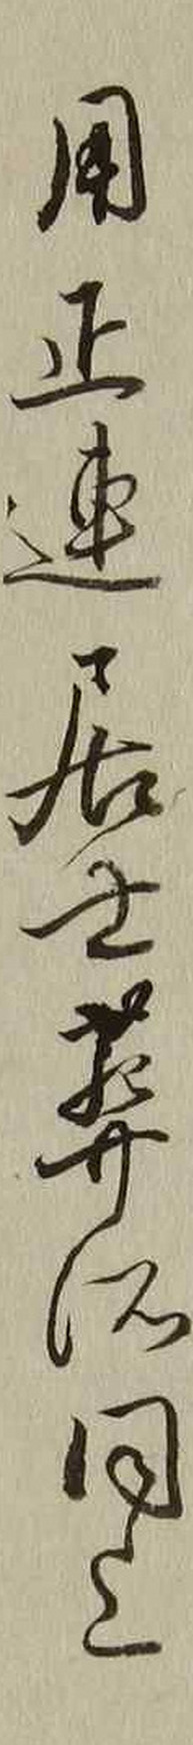用正連居士葬所同上
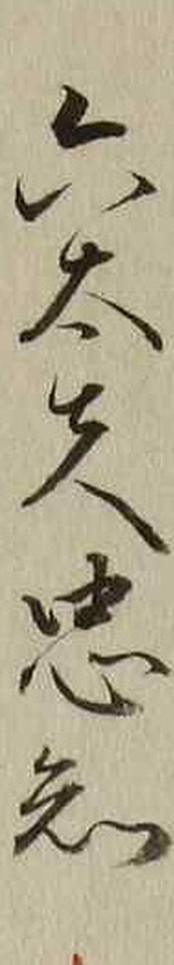六太夫忠知
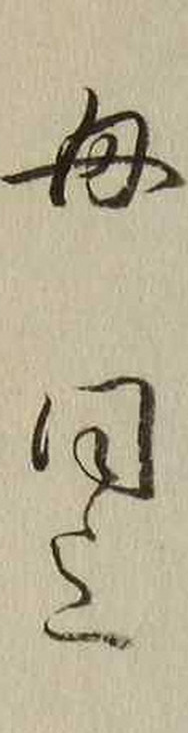母同上
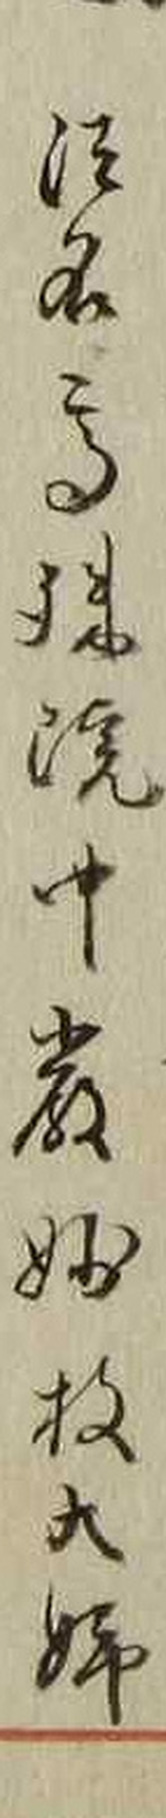法名高殊院中厳妙枝大姉
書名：諸士系譜　巻之2　い之部2
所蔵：会津若松市立会津図書館
